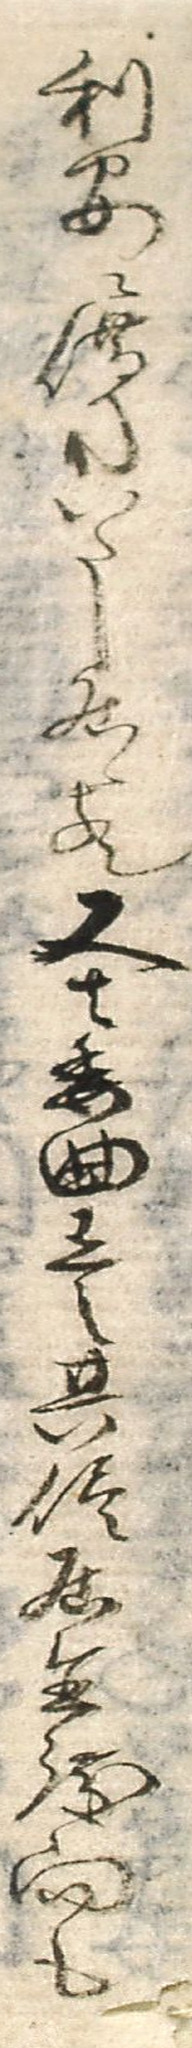利安に借用いたし居候歟又は委曲有之其儘居置度向も
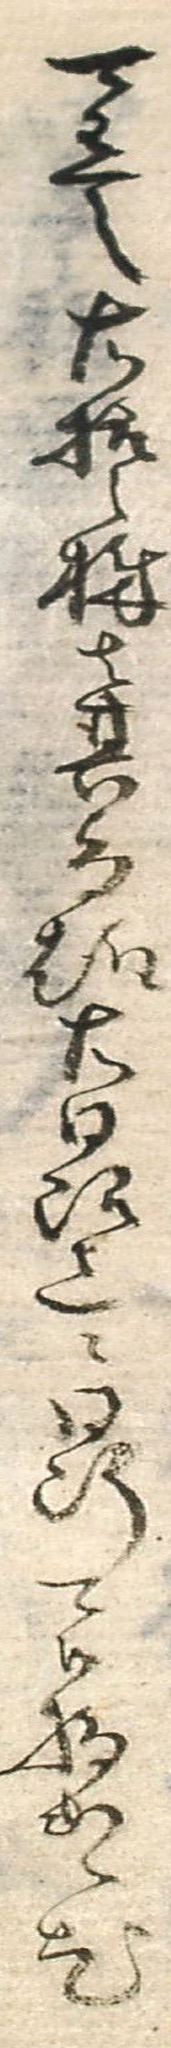可有之右様之株は其旨趣右日限迄に同断可被指出候尤
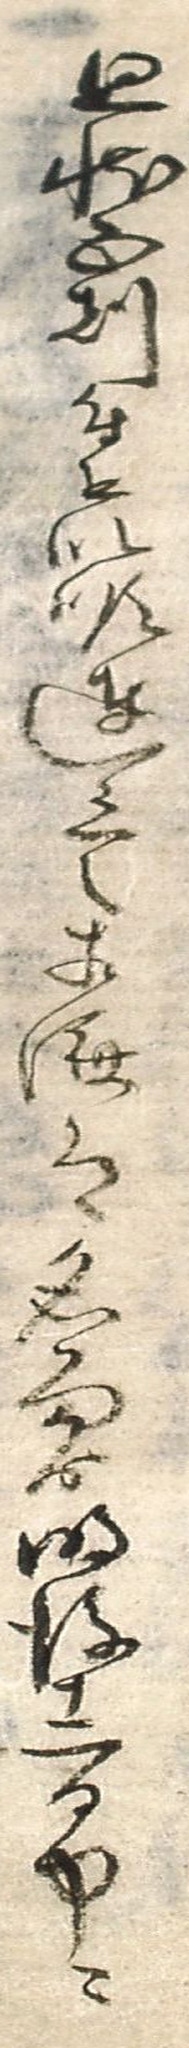回状正割付を以昨達立之相済候はゝ名面ゟ明後十二日中に
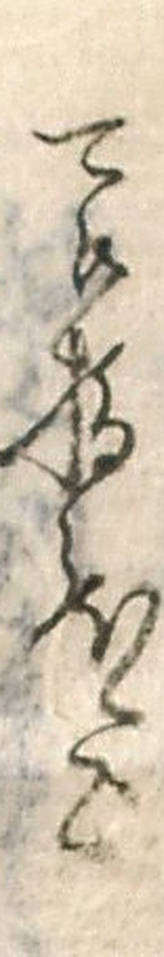可被指戻候以上
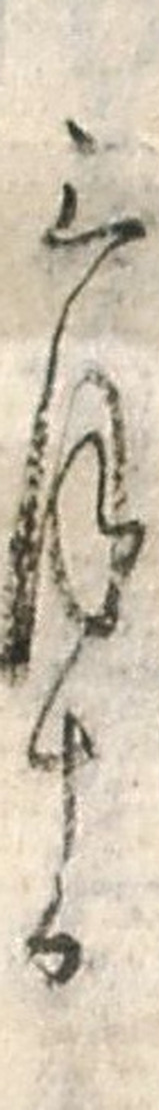三月十日
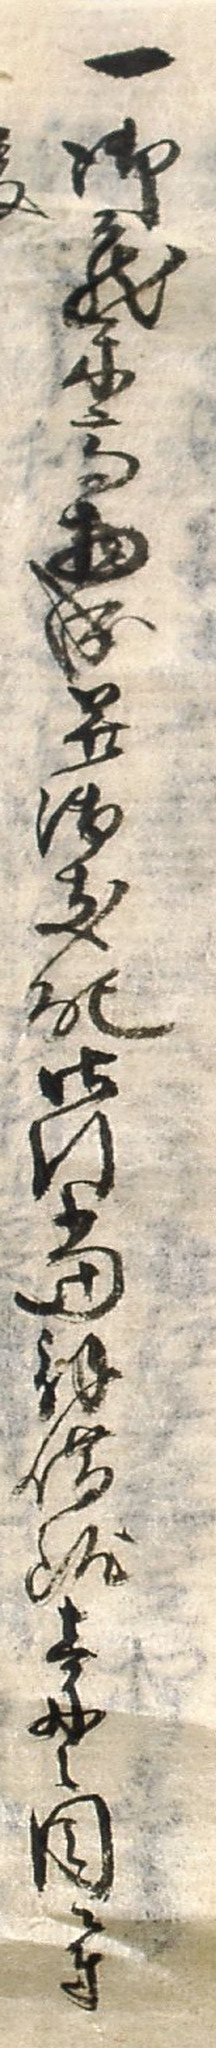一御蔵米高物成幷御支配御引当拝借銀壱貫目に付
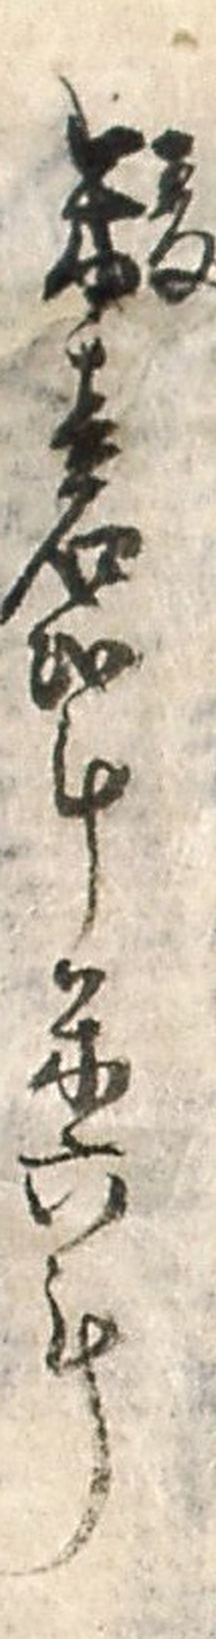米壱石弐斗米六斗
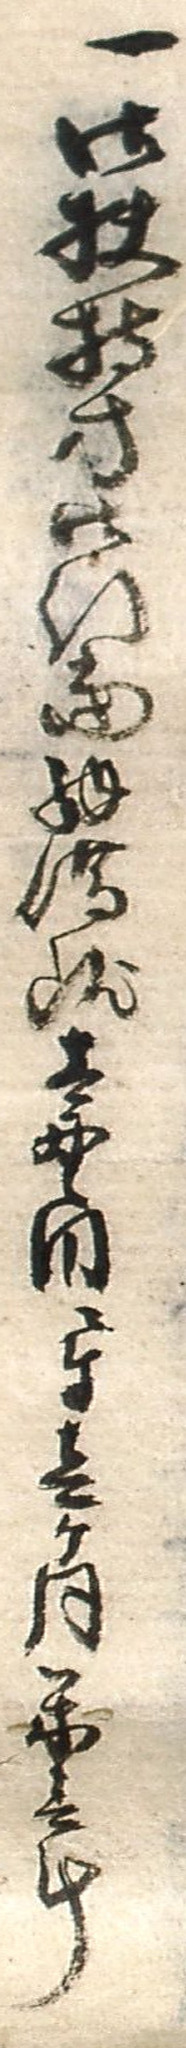一御扶持方御引当拝借銀壱貫目に付壱ヶ月米壱斗
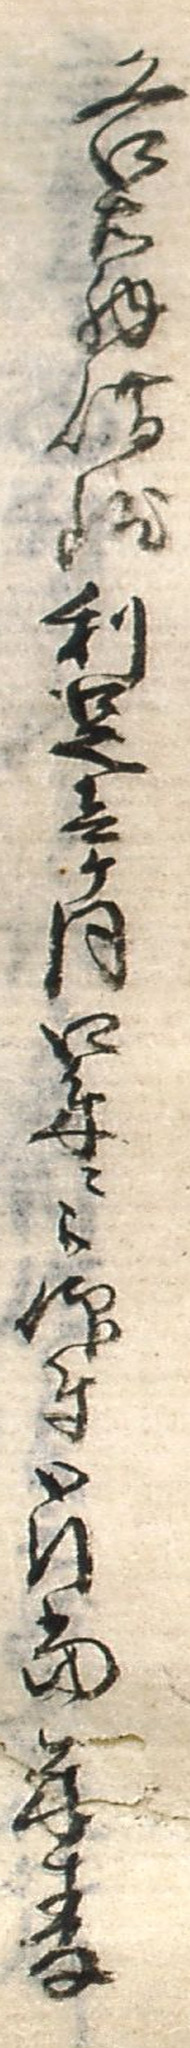各右拝借銀利足壱ヶ月四朱に被仰付御引当米麦
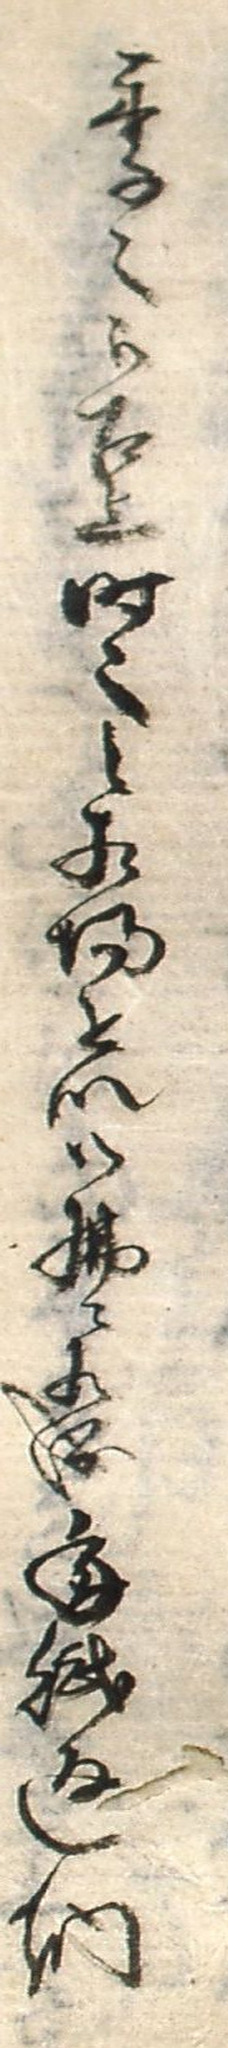季々被召上時々之相場を以御払に相成年賦返納
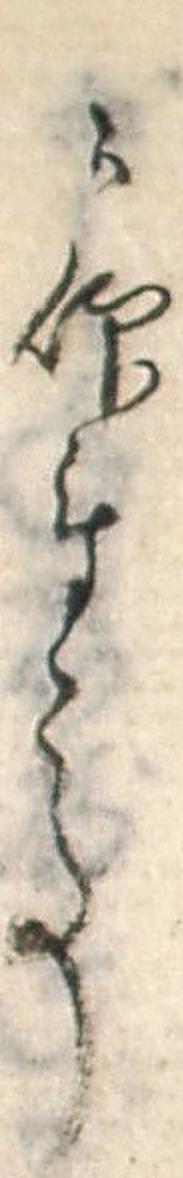被仰付候事
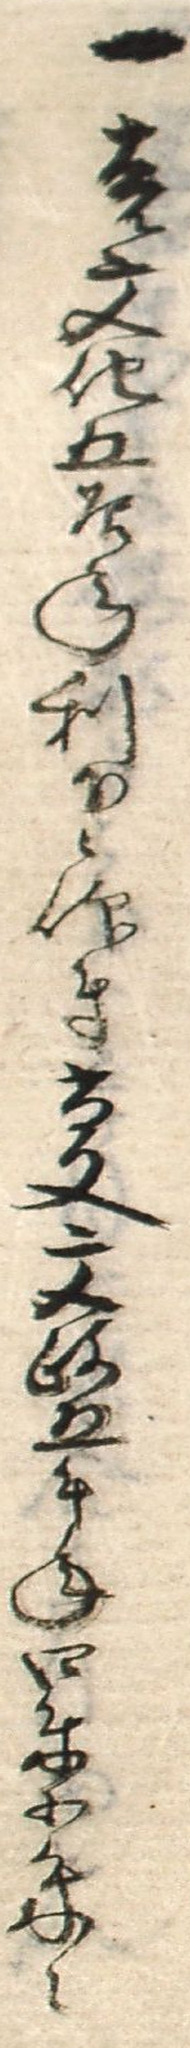一去る文化五辰年利下被仰付尚又文政五午年四朱五朱に
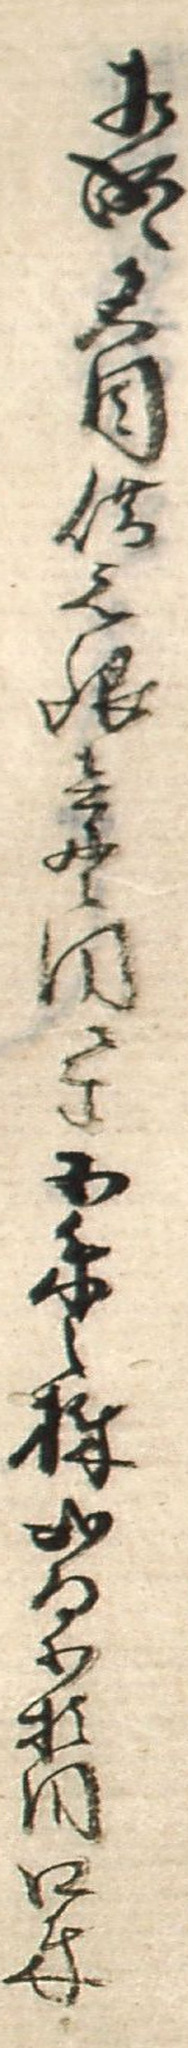相成候名目借元銀壱貫目に付五朱之株弐百五拾目四朱
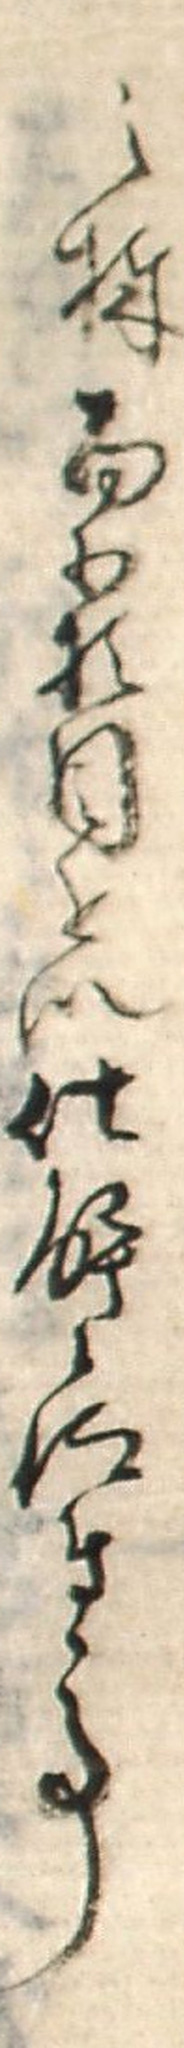之株百五拾目を以仕解被仰付候事
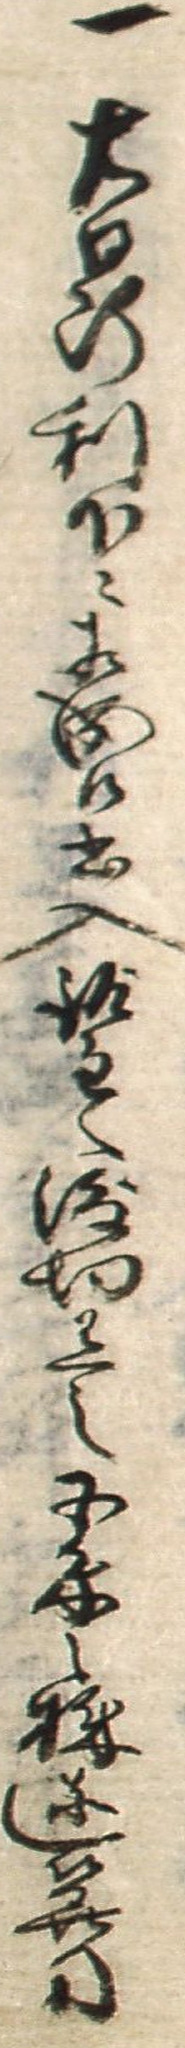一右同断利下に相成候書入銀主へ渡切有之五朱之株遂算用
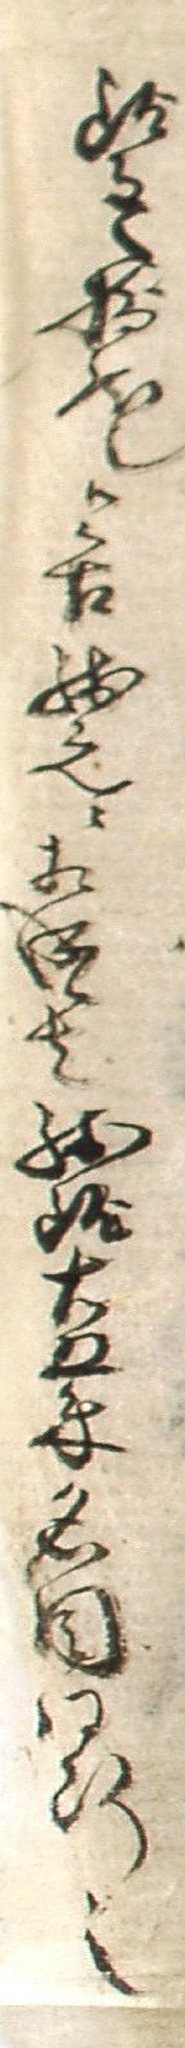銀主へ指戻し候筈残元に相成候は残銀右五朱名目同断之
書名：御家中并無格御奉公人借銀御仕解一件御書付写其余共控
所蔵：鳴門教育大学 Naruto University of Education
